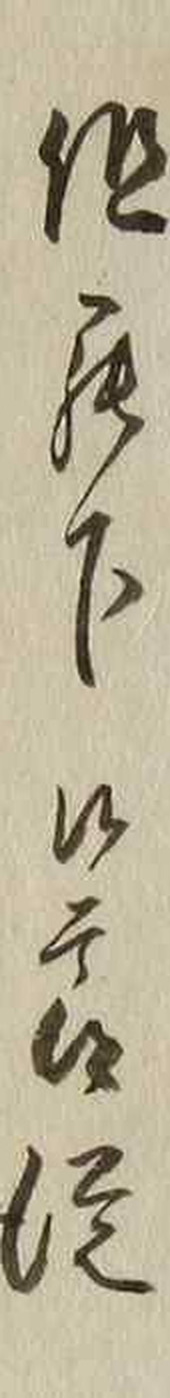但罷下候節従
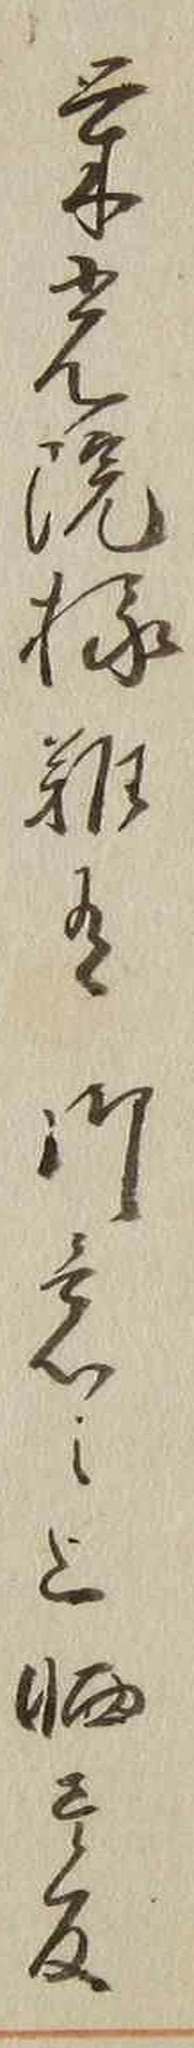栄光院様難有御意之上晒壱反
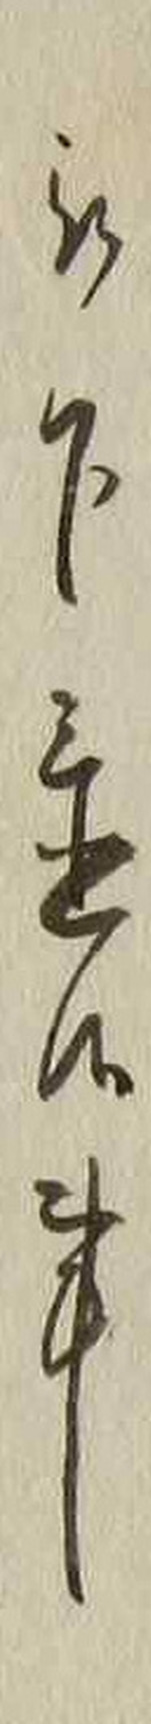被下置候事
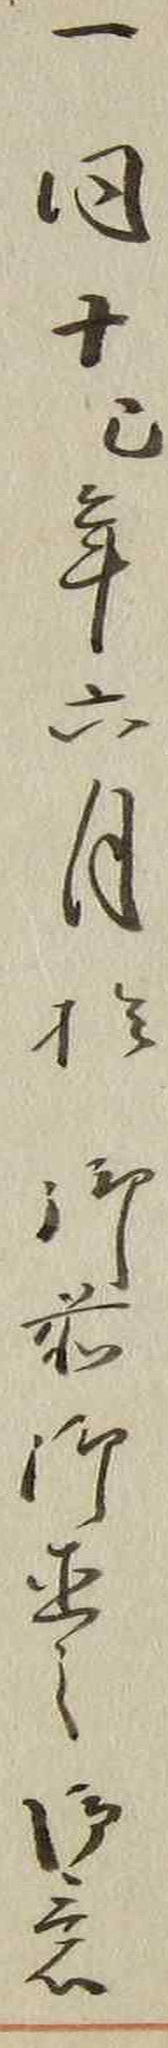一同十巳年六月於御前御直之御意
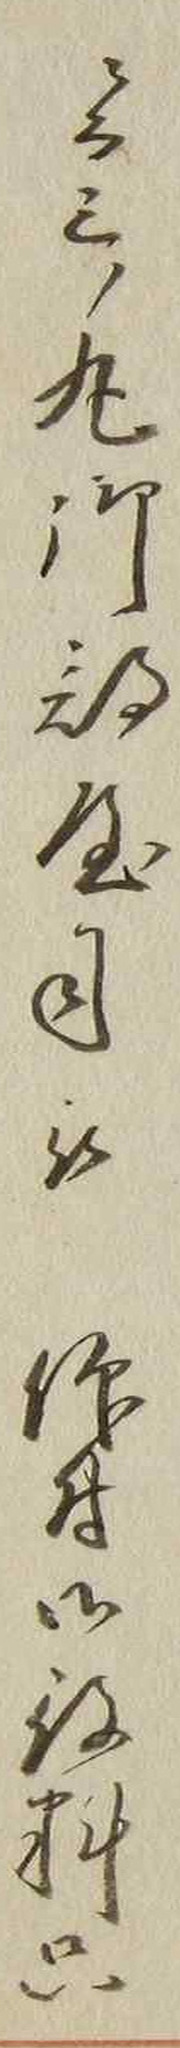ニ而三ノ丸御部屋司被仰付御役料只
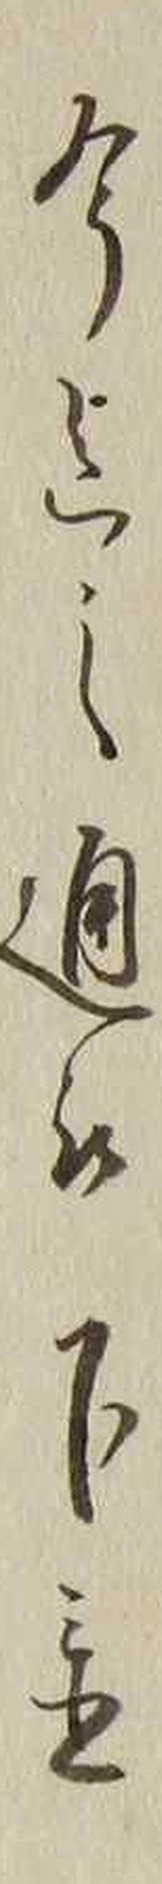今迄之通被下置
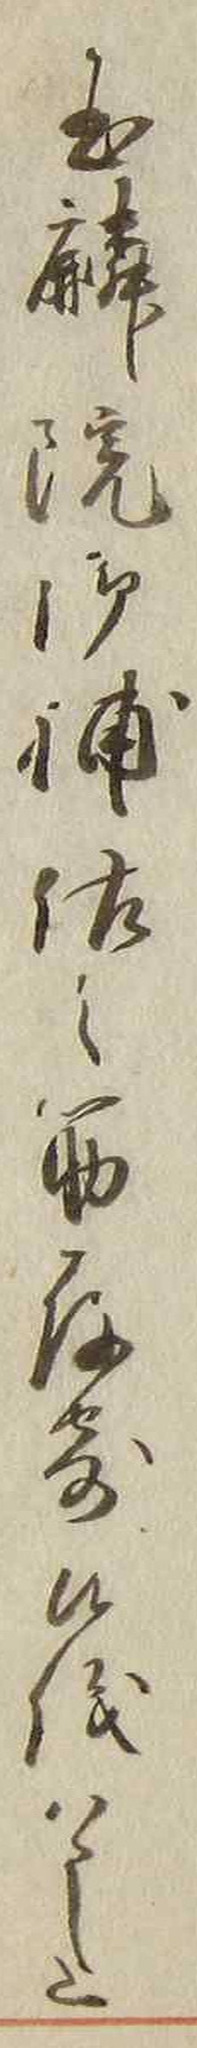玉隣院御補佐之筋存寄候儀ハ申上
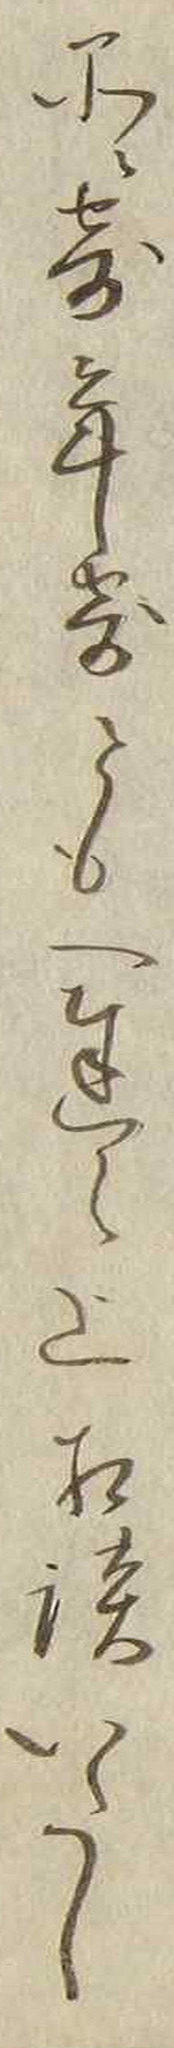品ニ寄年寄ともへ達之上相談いたし

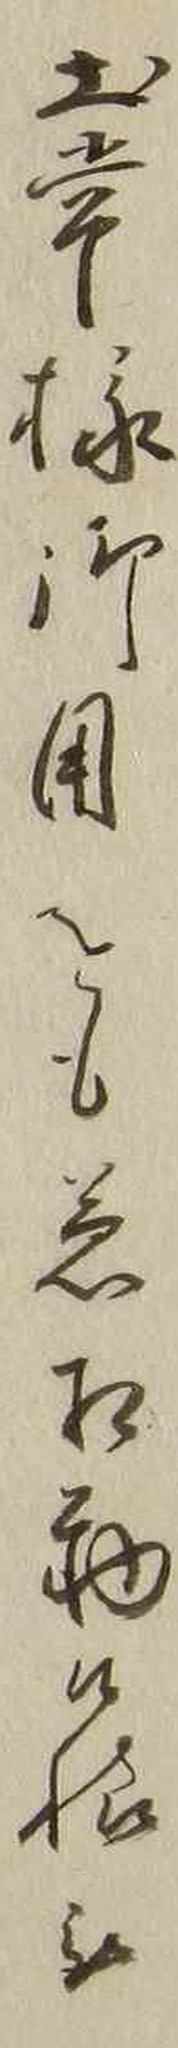土常様御用をも兼相勤候様被
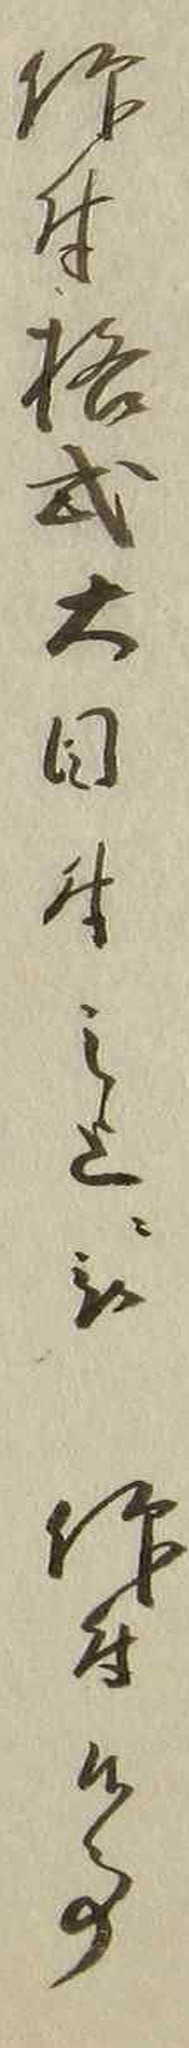仰付格式大目付之上ニ被仰付候事
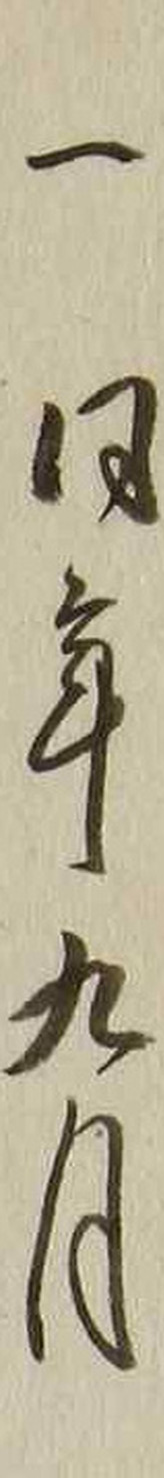一同年九月
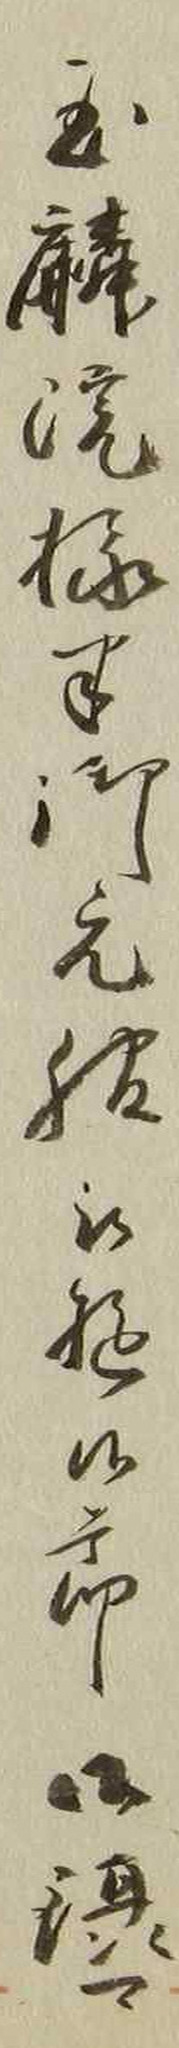玉麟院様半御元服被遊候節御鑷可
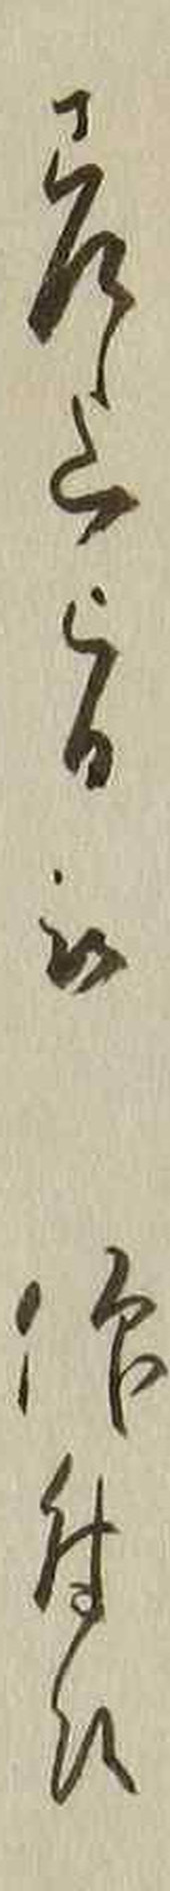差上旨被仰付候
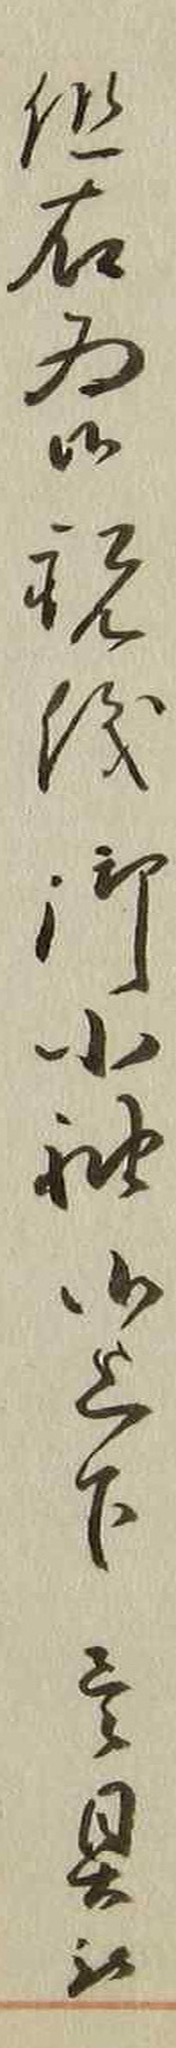但右為御祝儀御小袖御上下壱具被
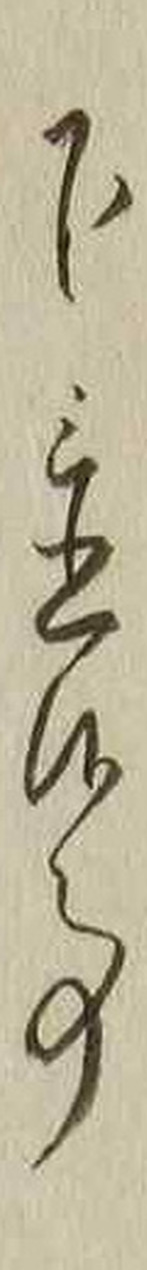下置候事
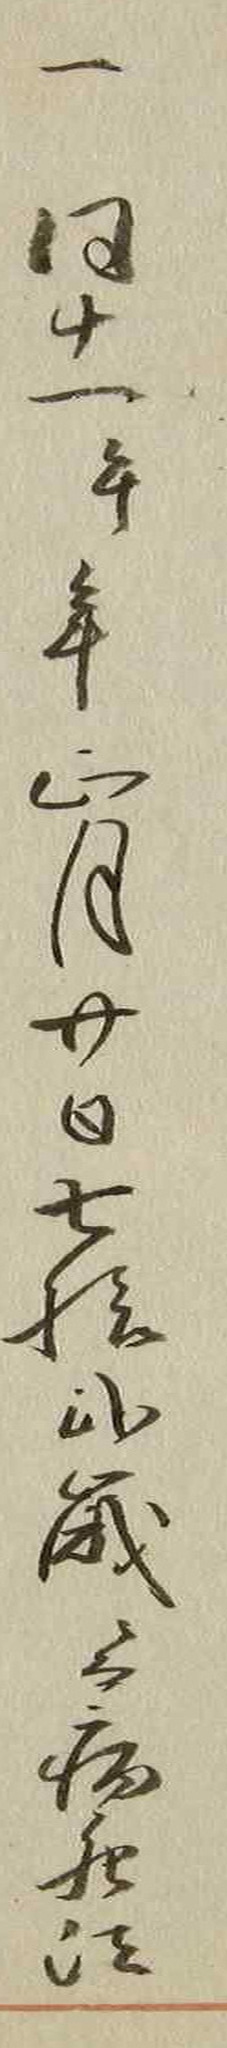一同十一午年正月廿日七拾弐歳ニ而病死法
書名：諸士系譜　巻之122　よ之部5
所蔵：会津若松市立会津図書館
